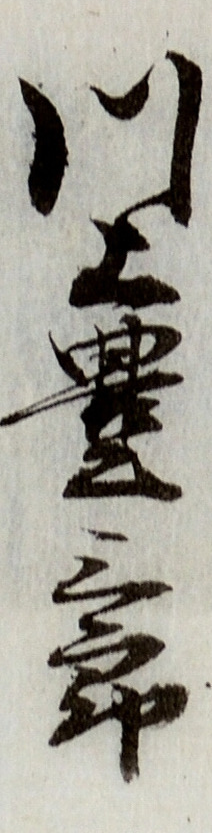川上豊三郎
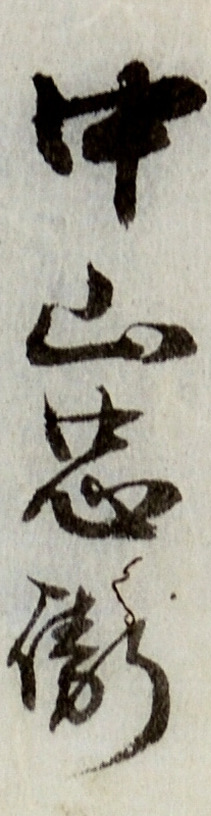中山忠衛
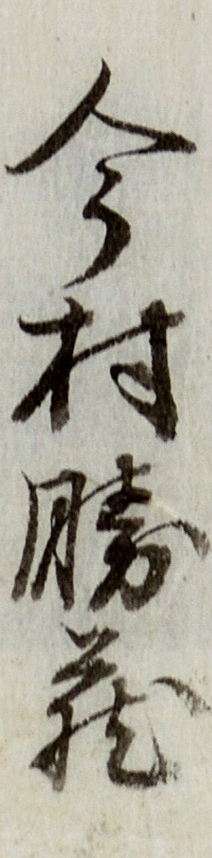今村勝蔵
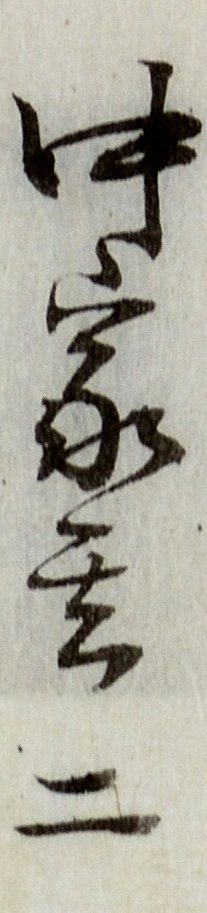中家玄二
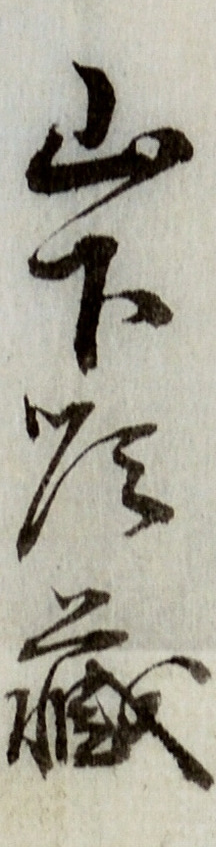山下順蔵
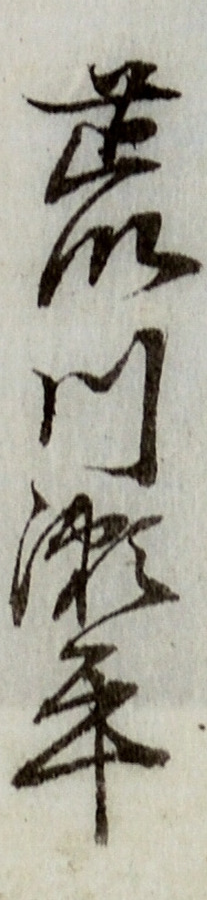荒川瀬平
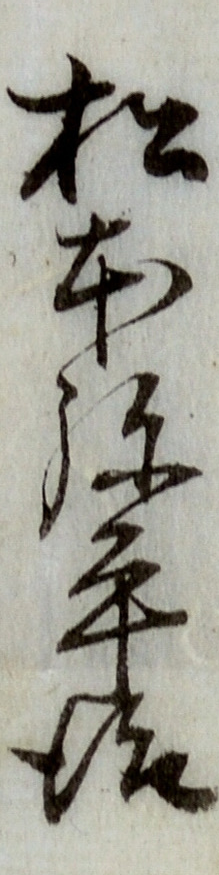松本弥平治

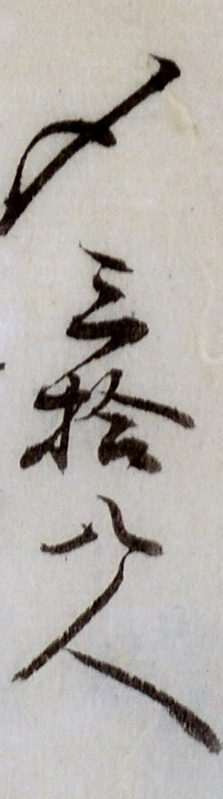〆三拾八人
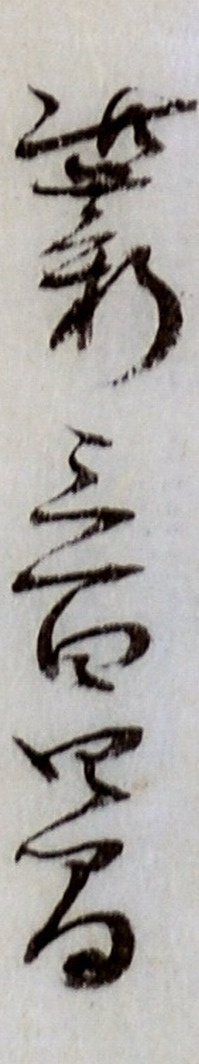此薪三百四間
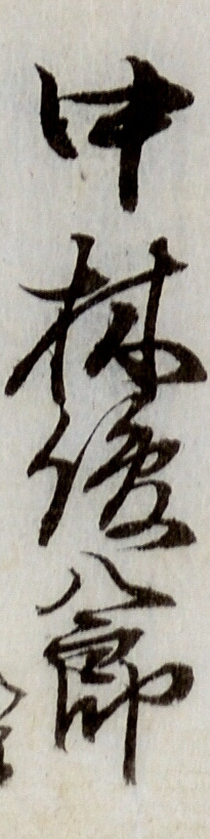中林俊八郎
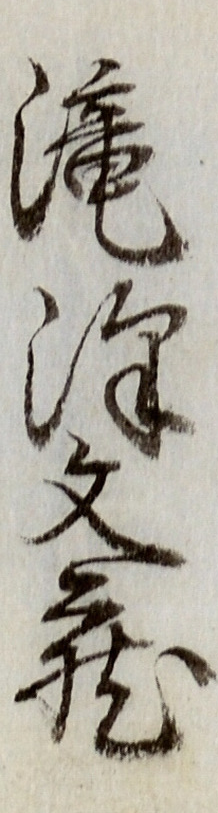滝沢文蔵
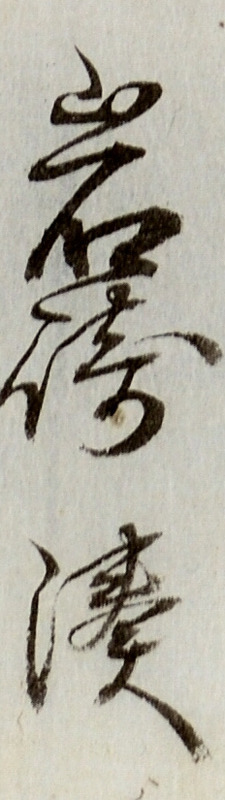岩崎湊
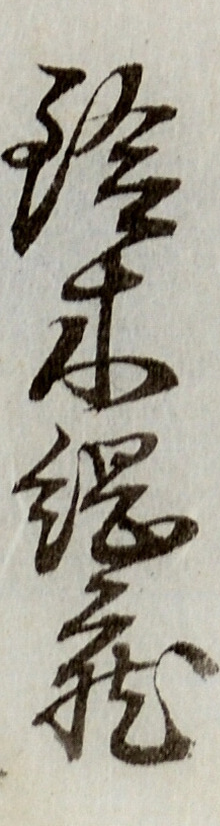鈴木総蔵
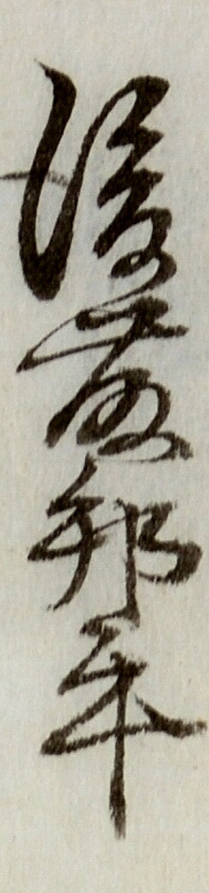後藤邦平
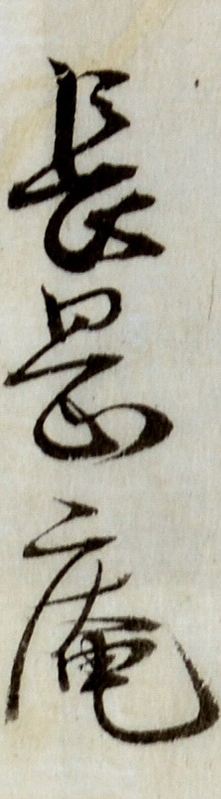長岡庵
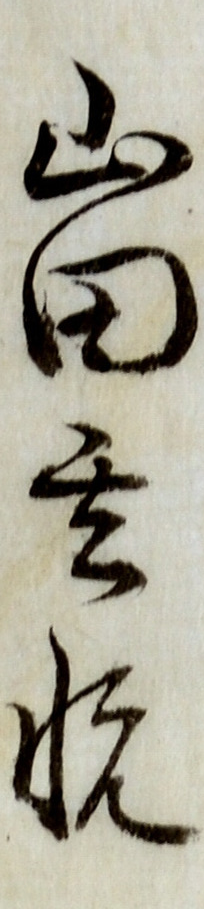山田玄悦
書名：御藩中薪渡割合帳
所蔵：伊那市立高遠町図書館・合同会社AMANE
